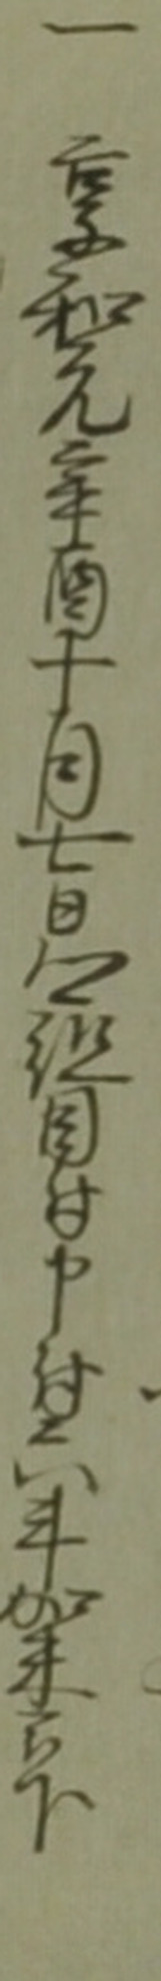一享和元辛酉十月七日郷組目付申付六斗加米被下
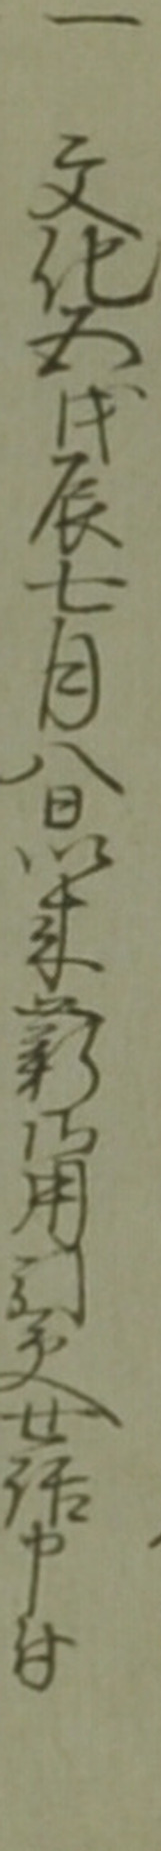一文化五戊辰七月八日以来薪御用引受世話申付
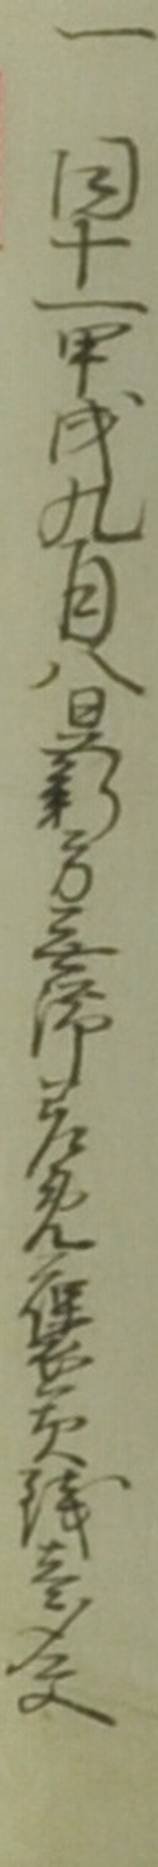一同十一甲戌九月八日薪方無滞差免褒美銭壱〆文
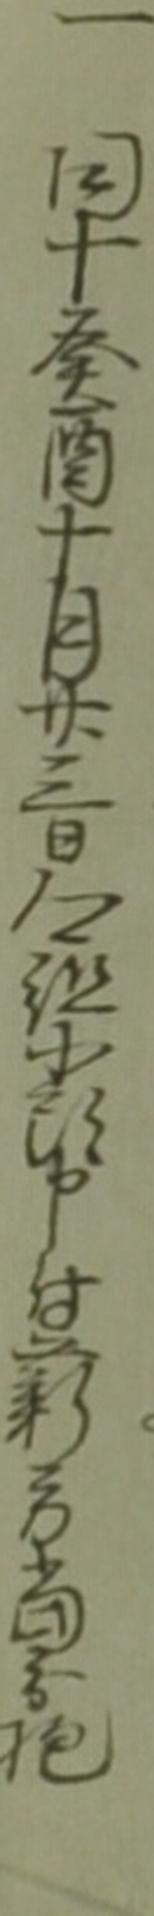一同十癸酉十月廿三日郷組小頭申付薪方当分抱
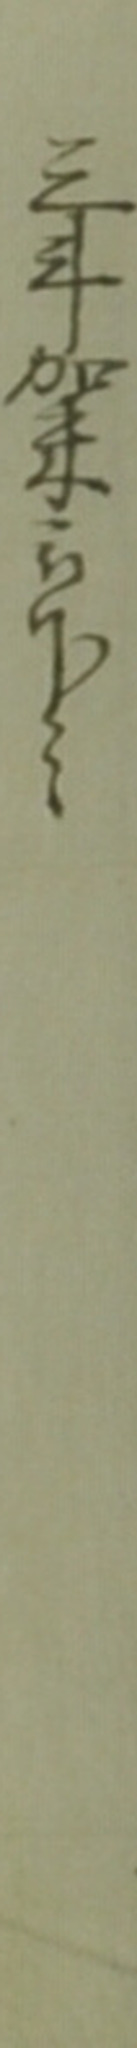三斗加米被下之
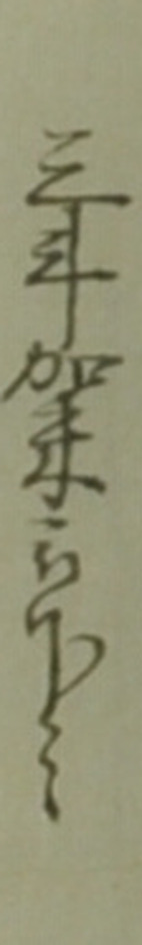三斗加米被下之

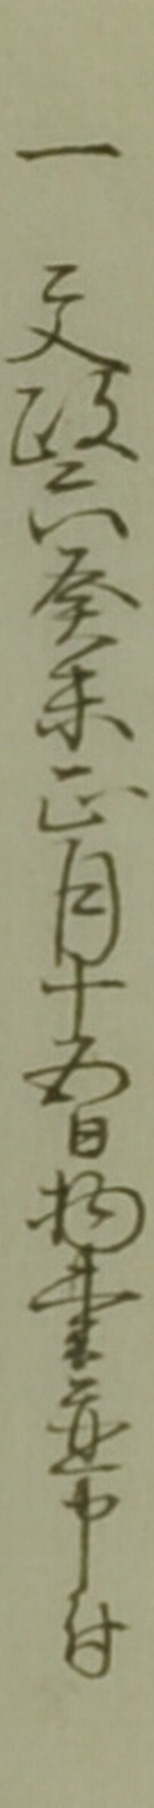一文政六癸未正月十五日物書並申付
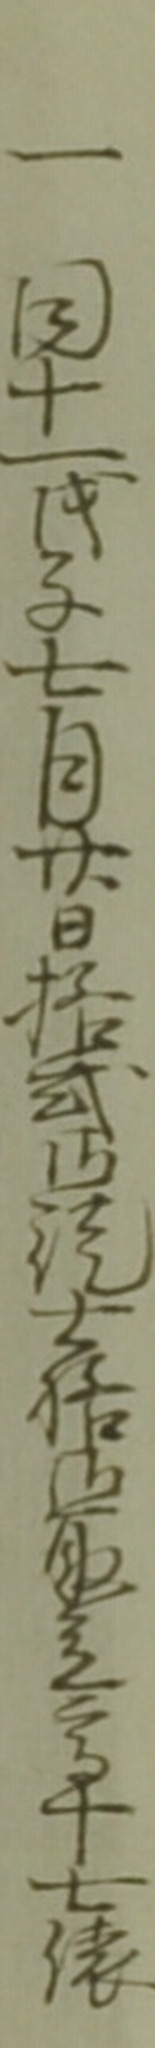一同十一戊子七月廿日格式御徒士格御取立高十七俵
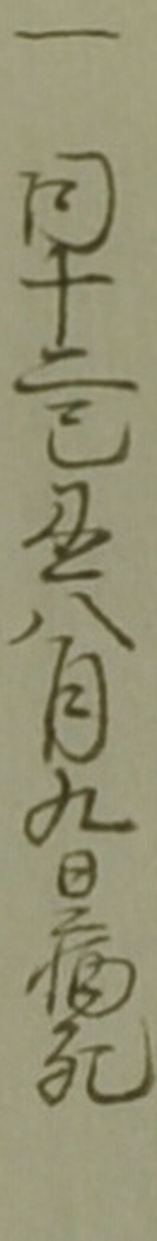一同十二己丑八月九日病死
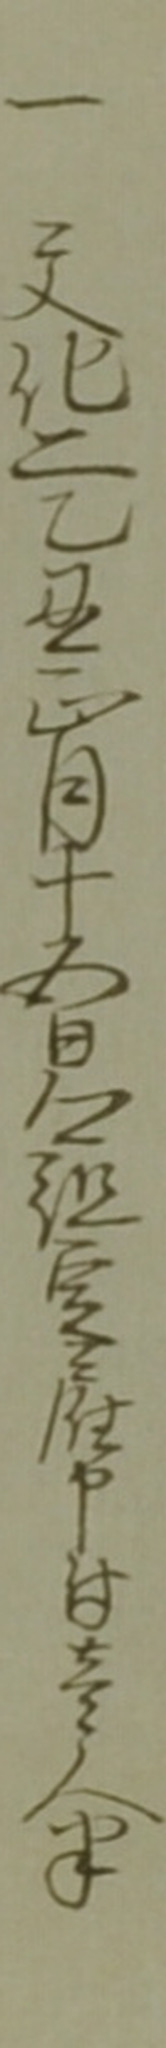一文化二乙丑正月十五日郷組定雇申付壱人半
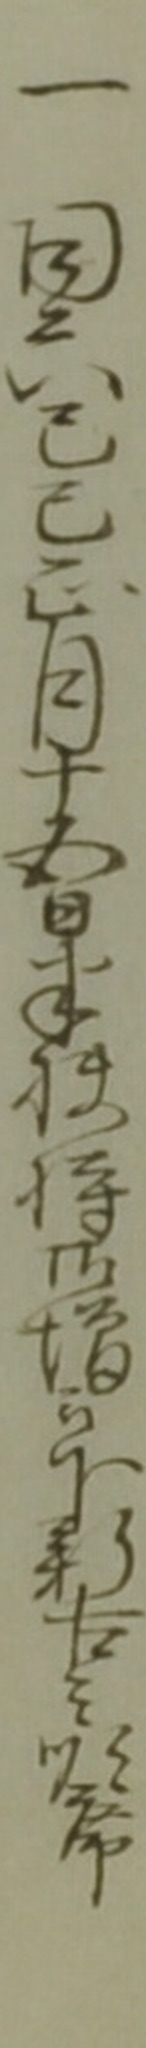一同六己巳正月十五日半扶持御増被下新古之順席
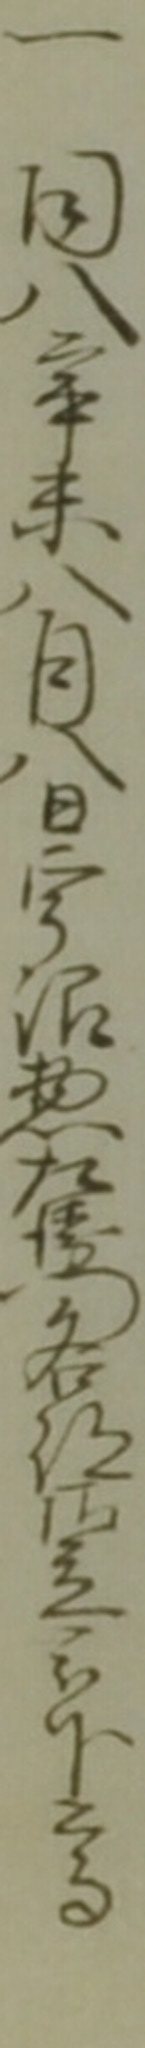一同八辛未八月八日宇沼惣左衛門名跡御立被下高
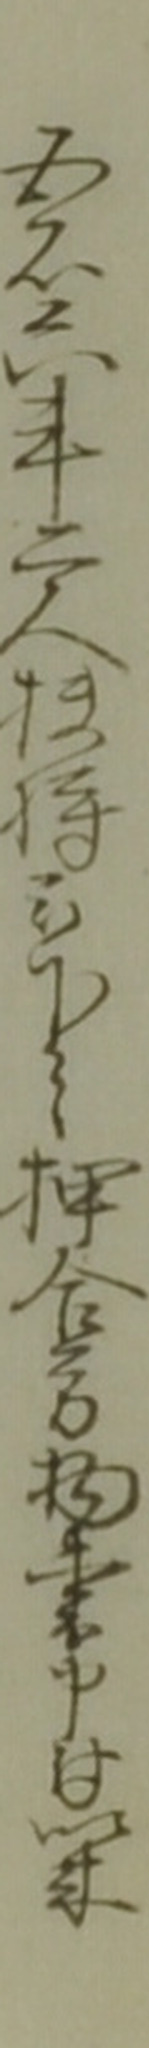五石六斗二人扶持被下之押合方物書申付以来
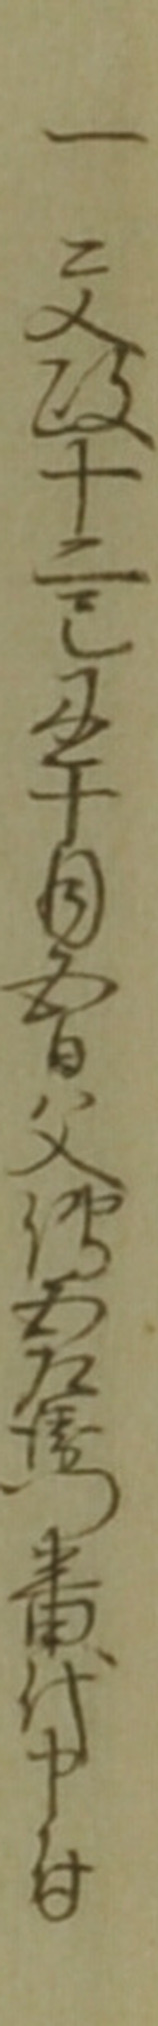一文政十二己丑十月五日父伝五左衛門番代申付
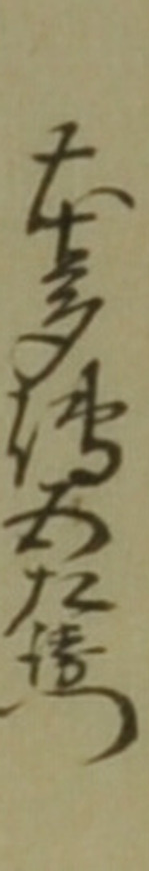本多伝五左衛門

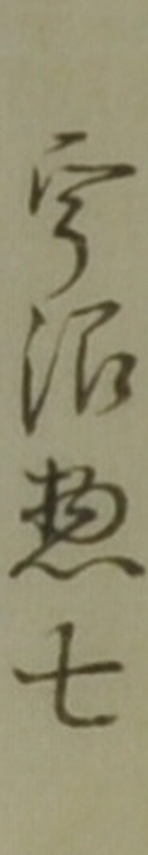宇沼惣七
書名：無足諸士勤仕録（九）
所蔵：伊那市立高遠町図書館・合同会社AMANE
